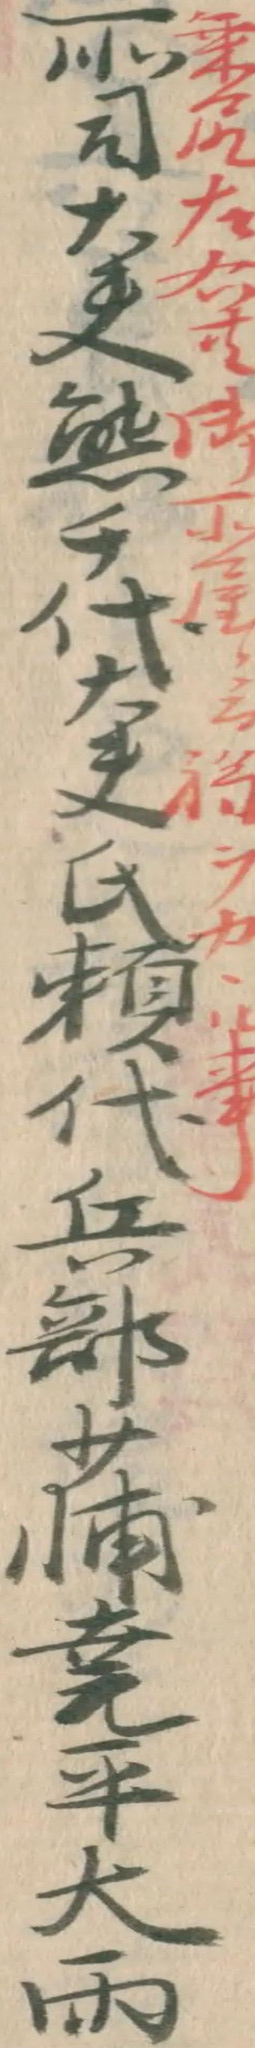所司大夫熊千代大夫氏頼代兵部少輔堯平大雨
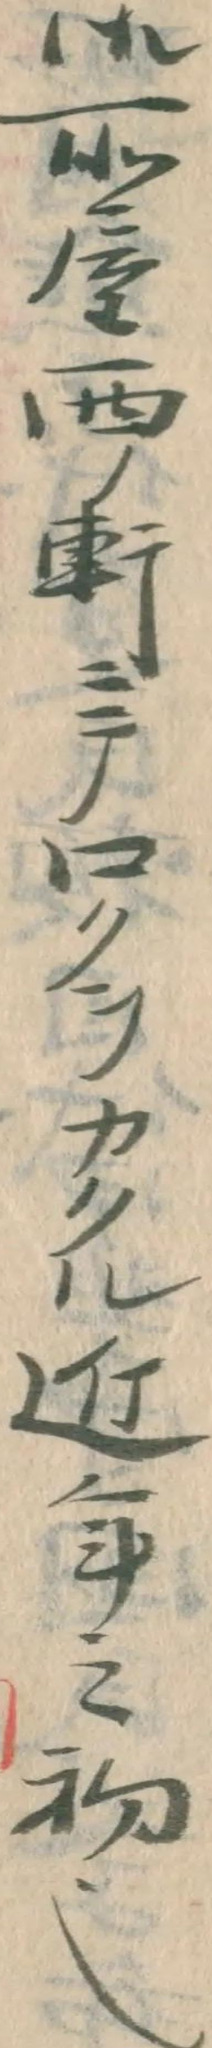御所屋西ノ軒ニテロクヲカクル近年之初也
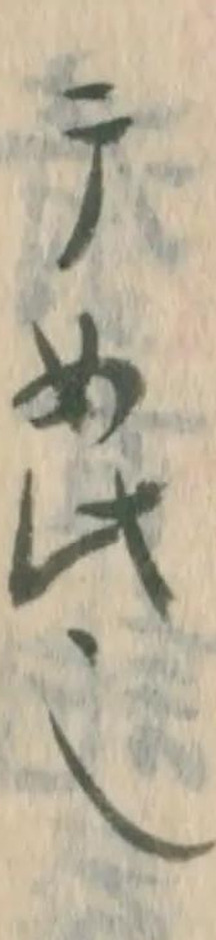テ如此也

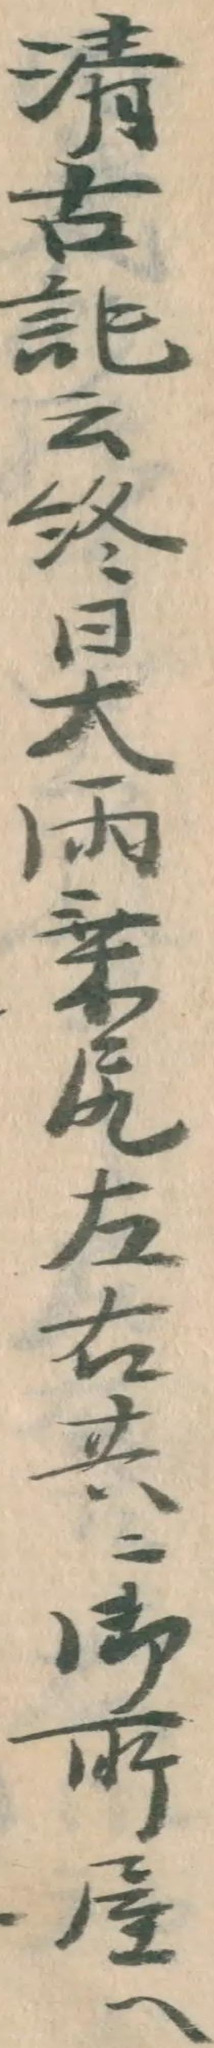清古記云終日大雨乗尻左右共ニ御所屋ヘ
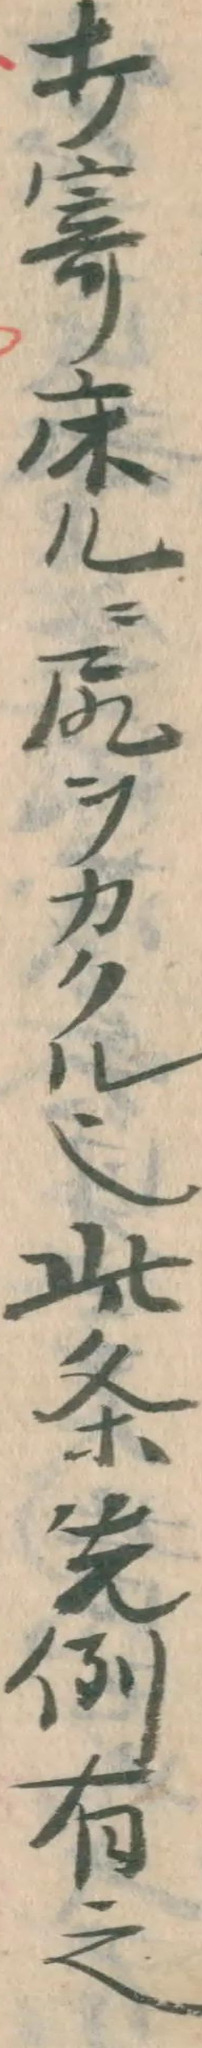打寄床几ニ尻ヲカクル也此条先例有之
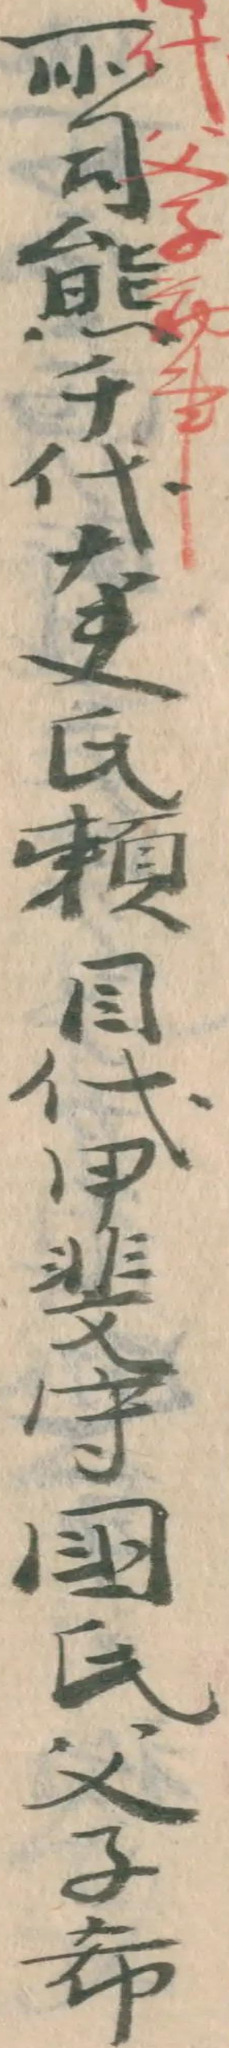所司熊千代大夫氏頼目代甲斐守国氏父子希
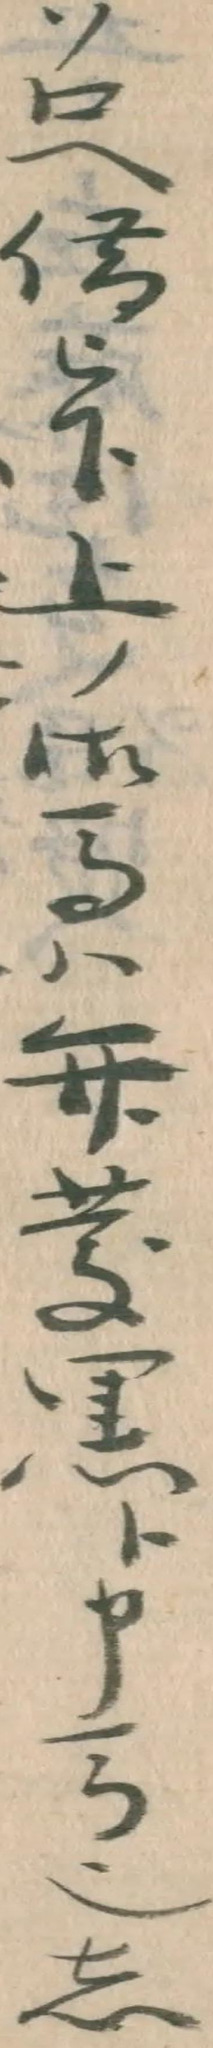ソロへ借被下上ノ御馬ハ弁慶黒ト申馬也し
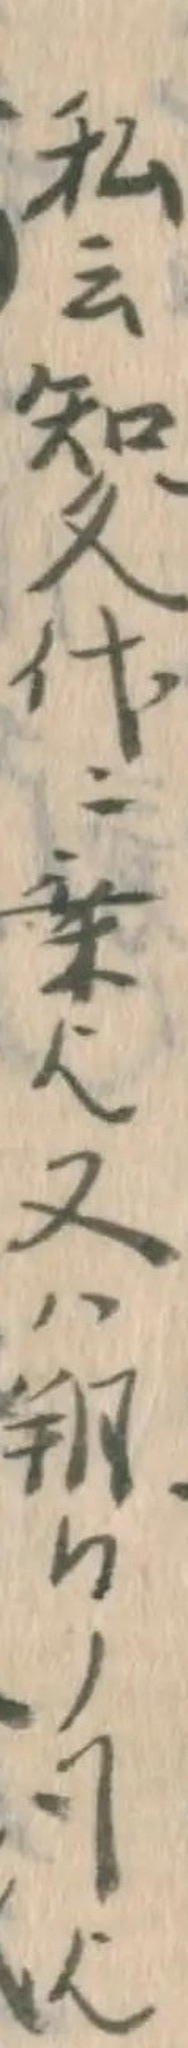私云知久代ニ乗也又ハ朔日ノコト也
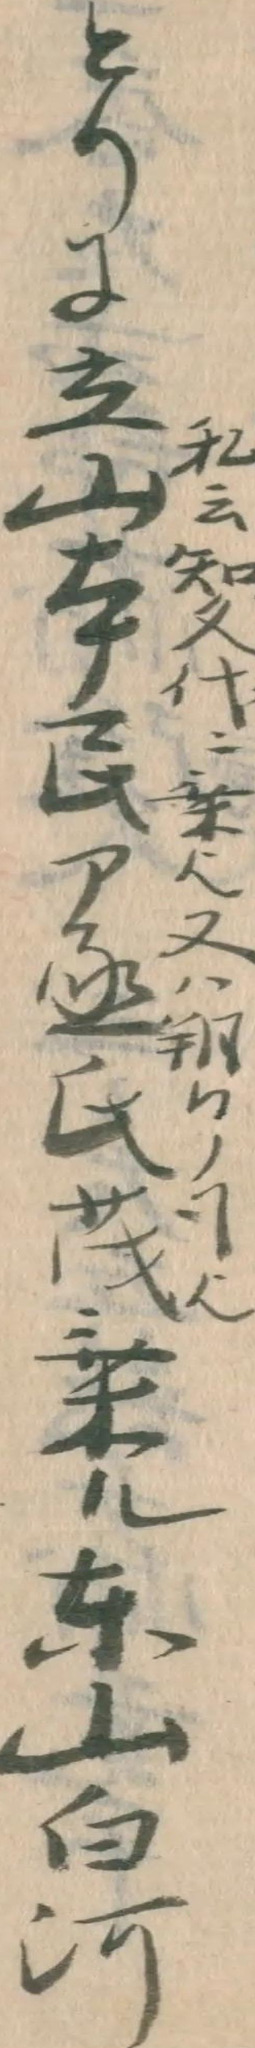とりに立山本民部丞氏茂乗ル東山白河
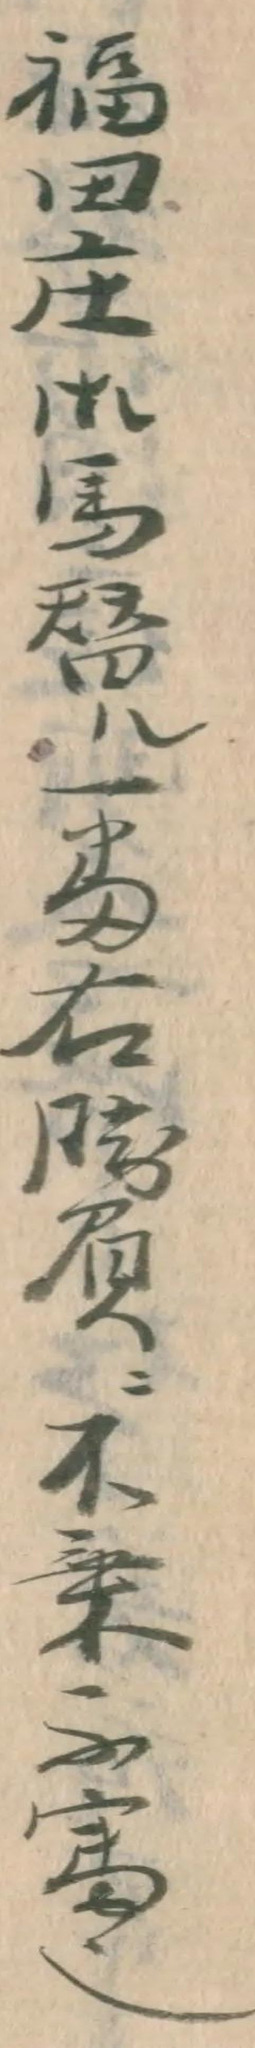福田庄御馬替ル一番右勝負ニ不乗不審也
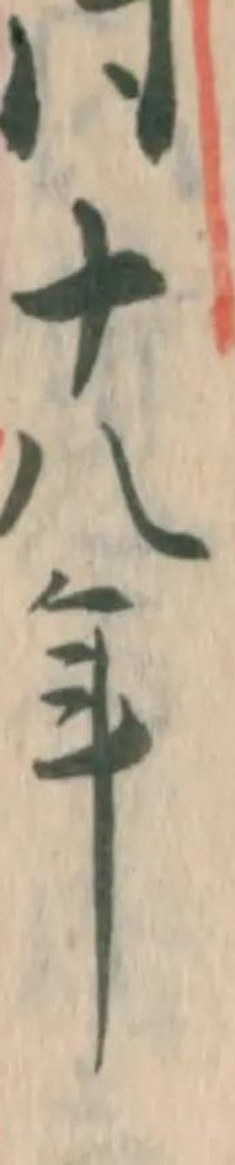同十八年
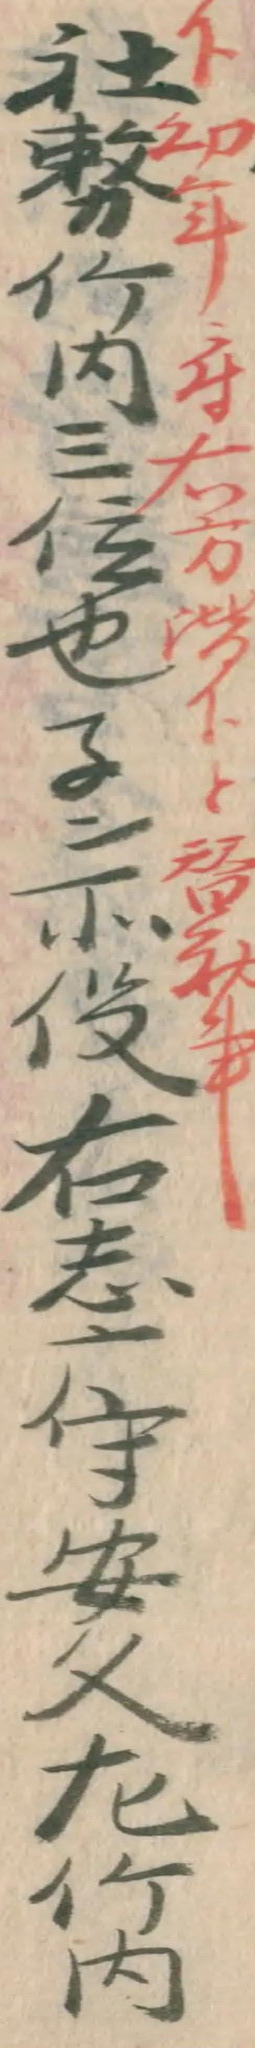社務竹内三位也子ン所役右志摩守安久左竹内
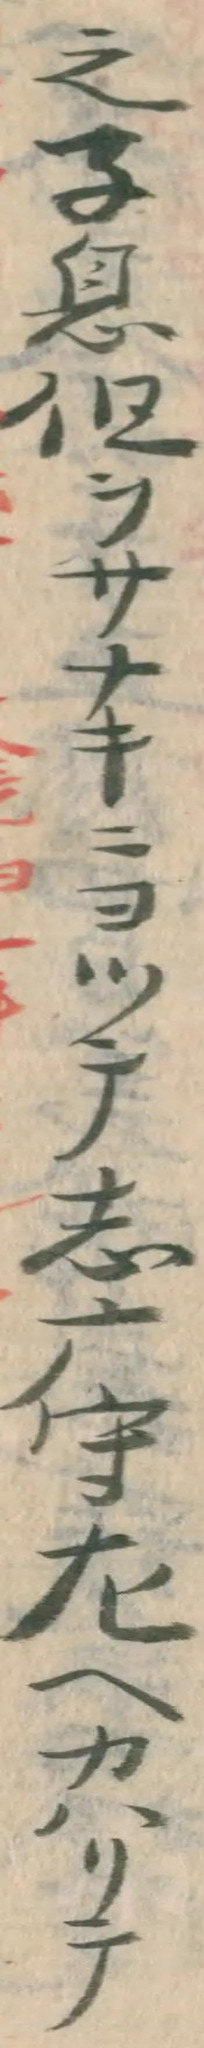之子息但ヲサナキニヨツテ志摩守左ヘカハリテ
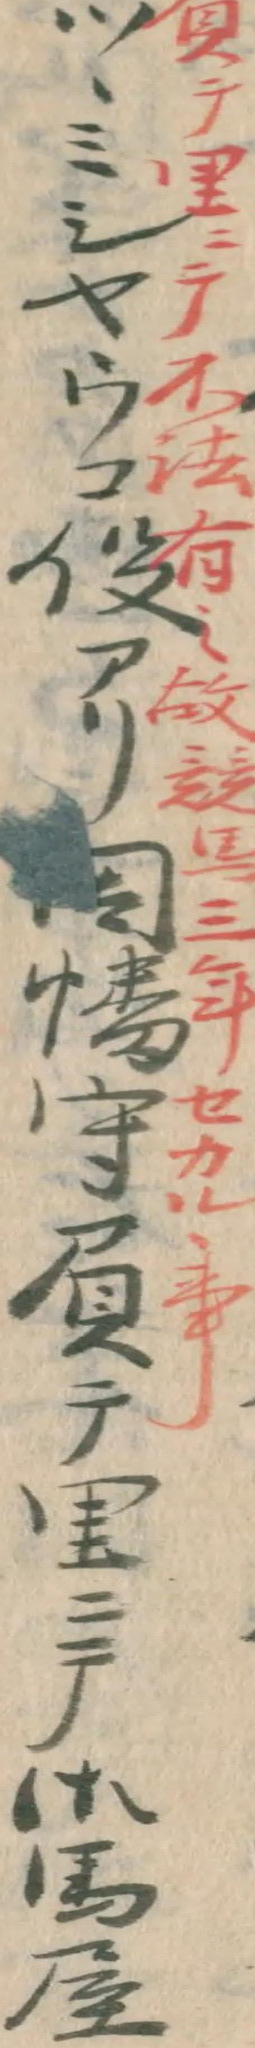ツヽミシヤウコ役アリ因幡守負テ里ニテ御馬屋
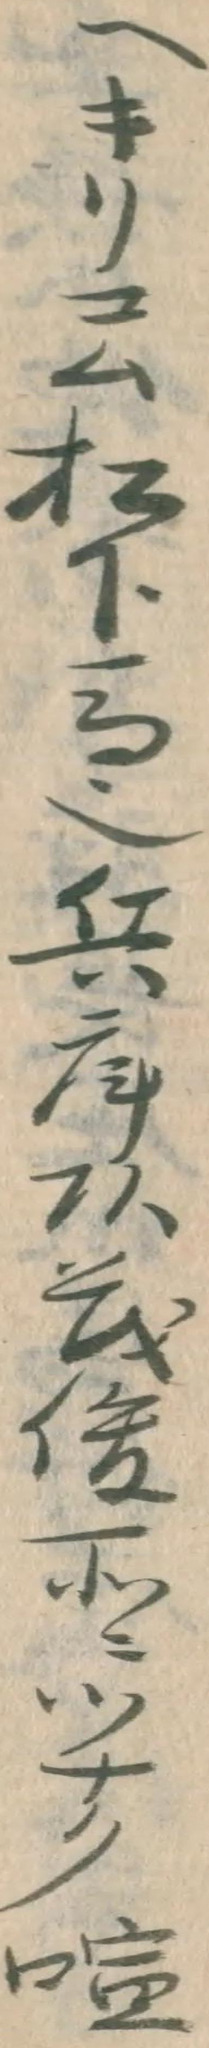ヘキリコム松下馬也兵庫頭茂俊所ニツナク喧
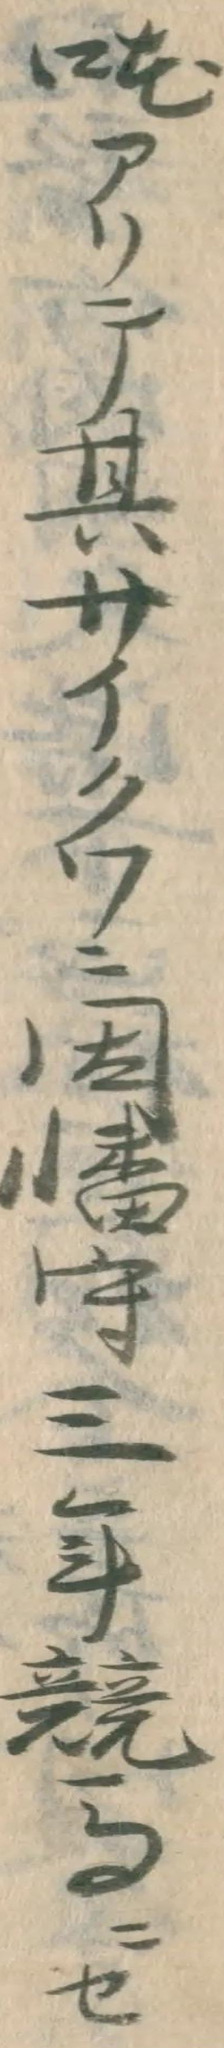嘩アリテ其サイクワニ因幡守三年競馬ニセ
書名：賀茂社記録. 第10冊
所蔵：国立国会図書館 National Diet Library, JAPAN
